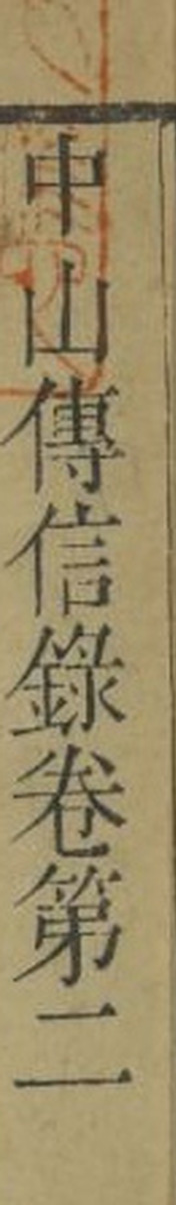中山傳信錄卷第二
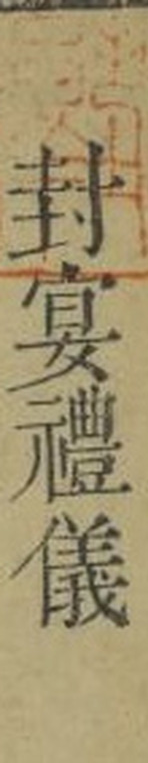封宴禮儀
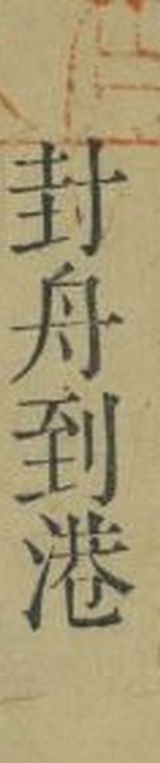封舟到港
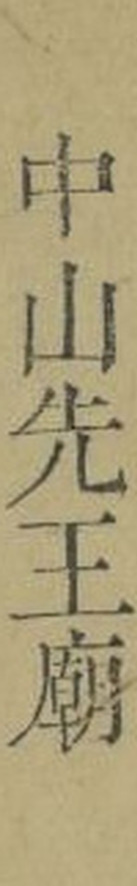中山先王廟
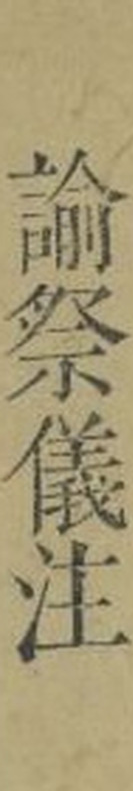諭祭儀注
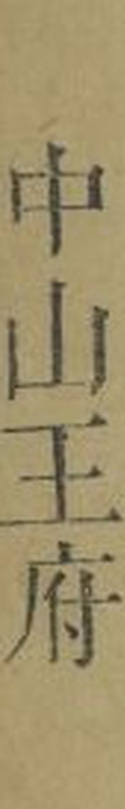中山王府

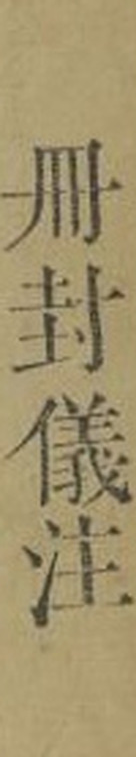冊封儀注
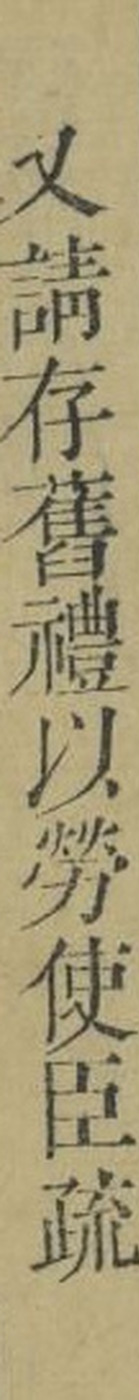又請存舊禮以勞使臣疏
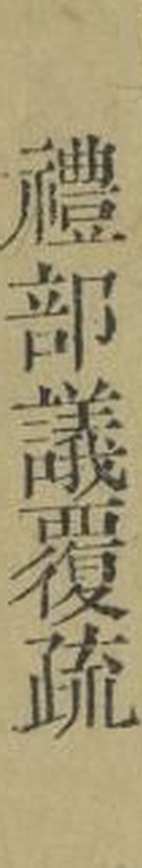禮部議覆疏
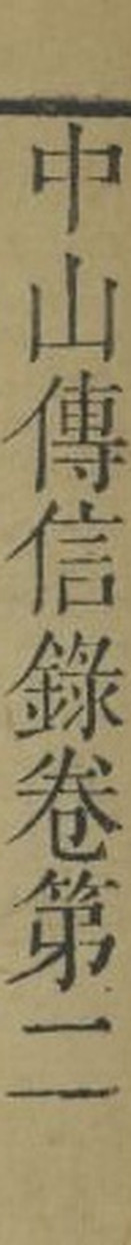中山傳信錄卷第二
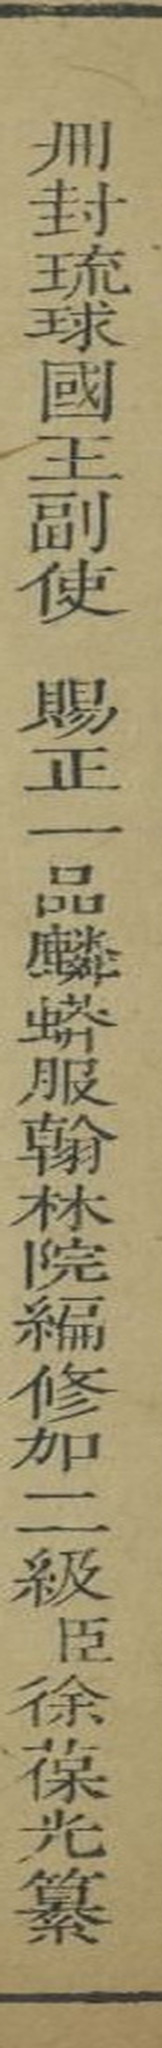冊封琉球國王副使賜正一品麟蟒服翰林院編修加二級臣徐葆光纂
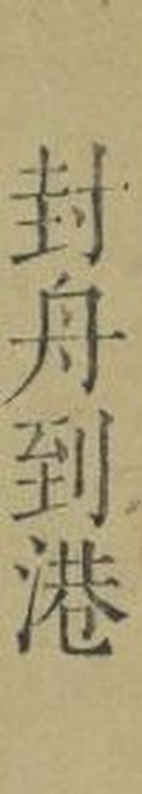封舟到港
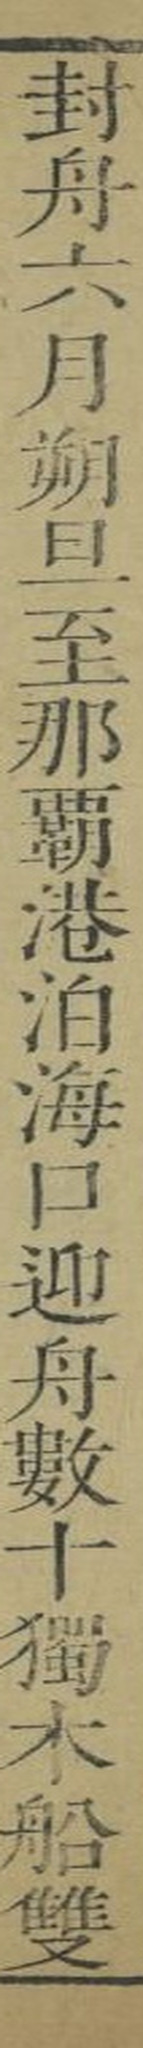封舟六月朔旦至那覇港泊海口迎舟數十獨木船雙
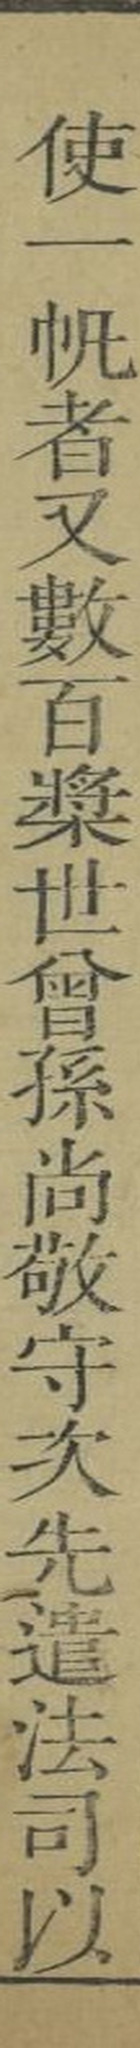使一帆者又數百槳世曾孫尚敬守次先遣法司以
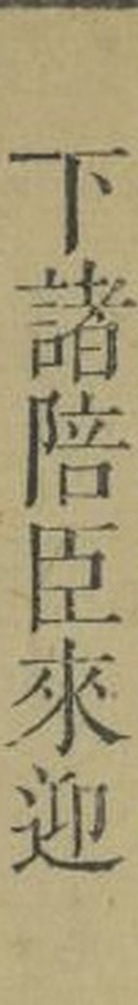下諸陪臣來迎
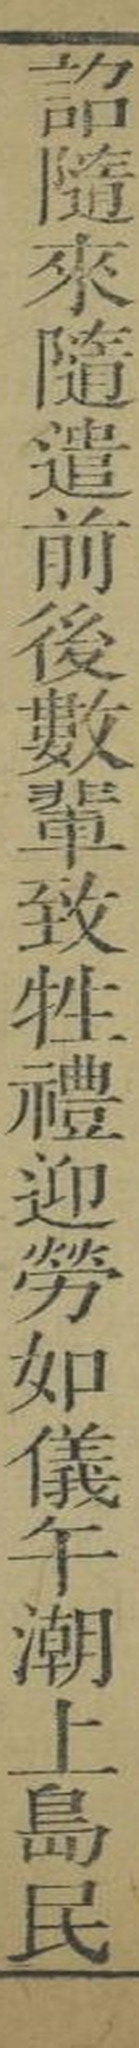詔隨來隨遣前後數輩致牲禮迎勞如儀午潮上島民
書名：中山伝信録 巻二
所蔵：University of the Ryukyus Library
